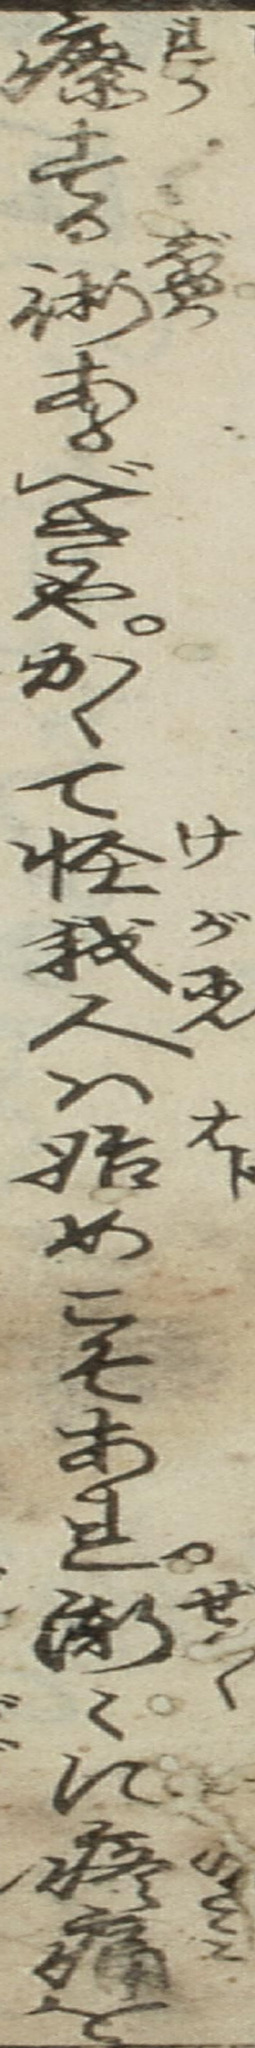療する術あるべきや。かくて怪我人は始めこそあれ。漸〳〵に疼痛を
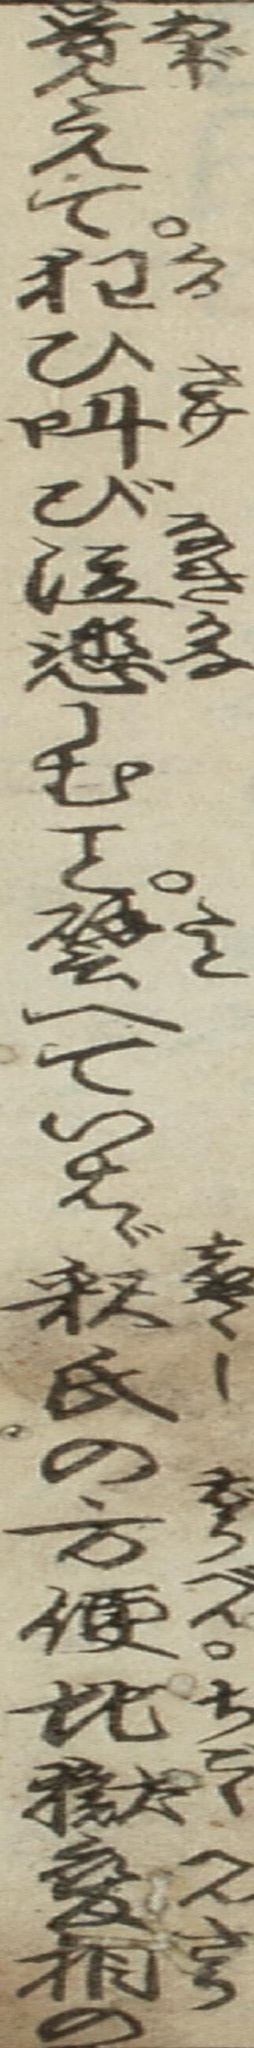覚えて。狂ひ叫び泣悲しむこと。譬へていはゞ。釈氏の方便。地獄変相の
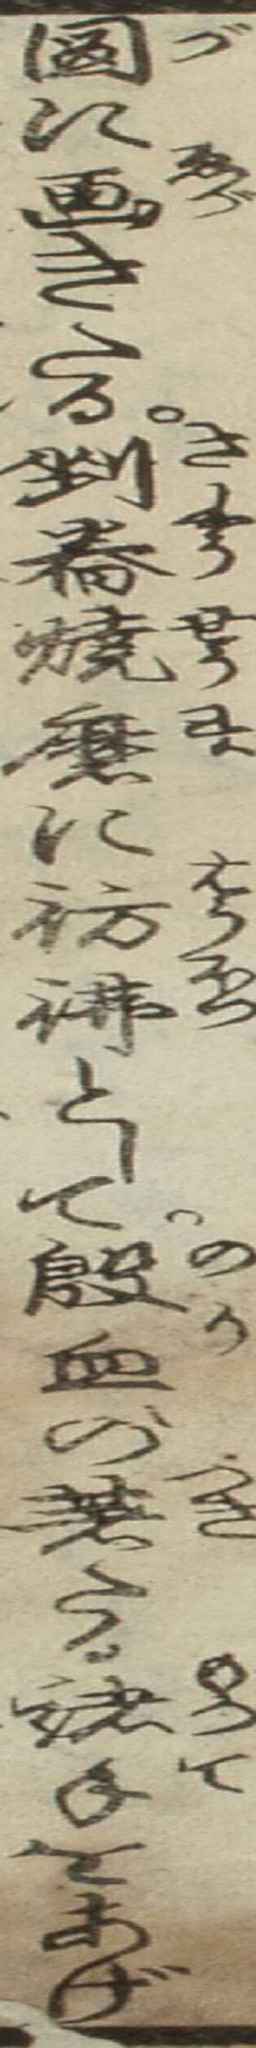圖に画きたる。剉舂焼魔に彷彿として。殷血の著たる諸手をあげ
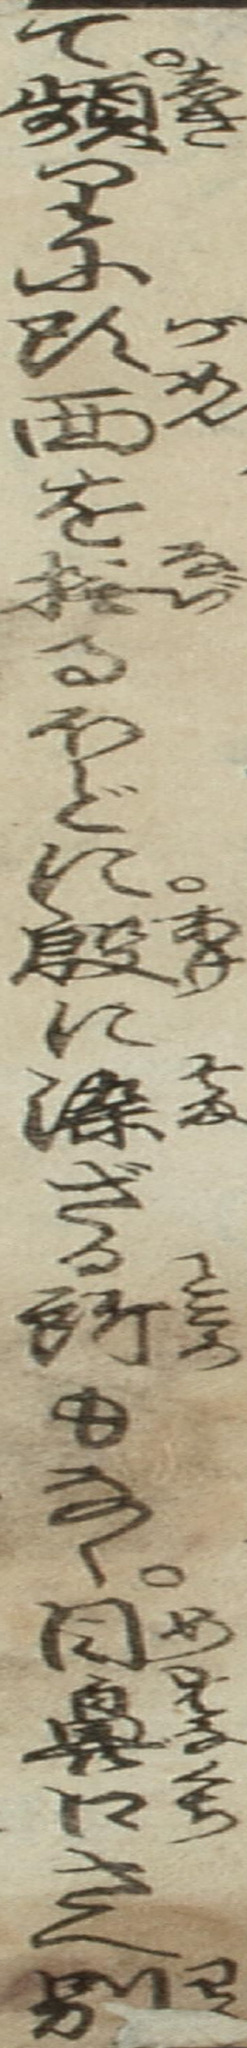て。頻りに頭面を撫るほどに。殷に染ざる所もなく。目鼻口さへ別
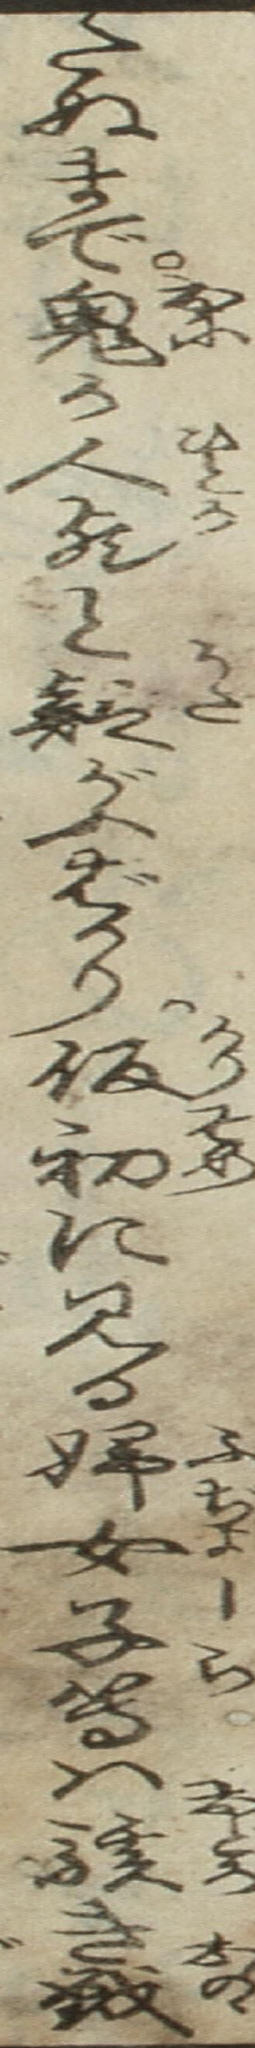たぬまで。鬼か人歟と疑がうばかり。仮初に見る婦女子等は駭き戦
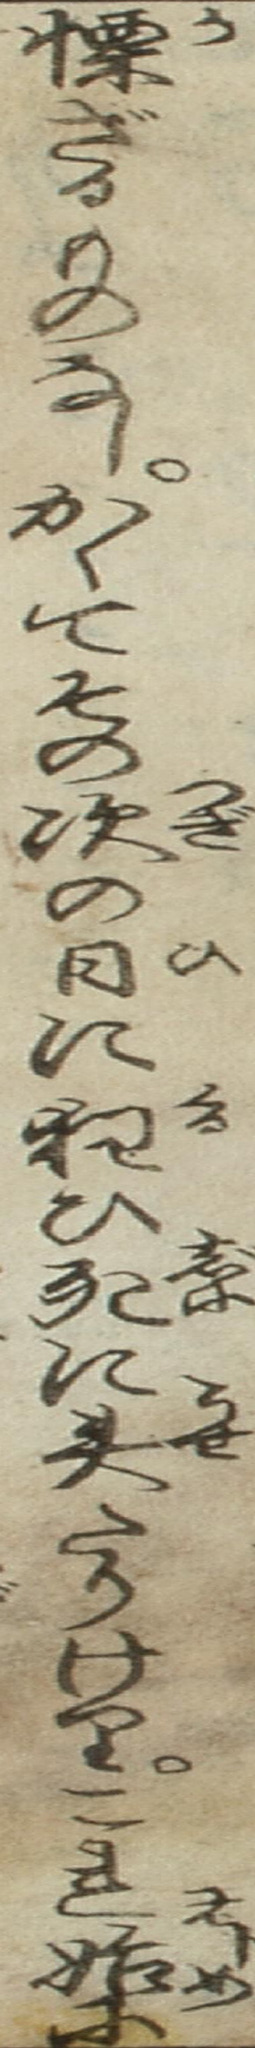慄ざるものなし。かくてその次の日に狂ひ死に失たりけり。これ始に
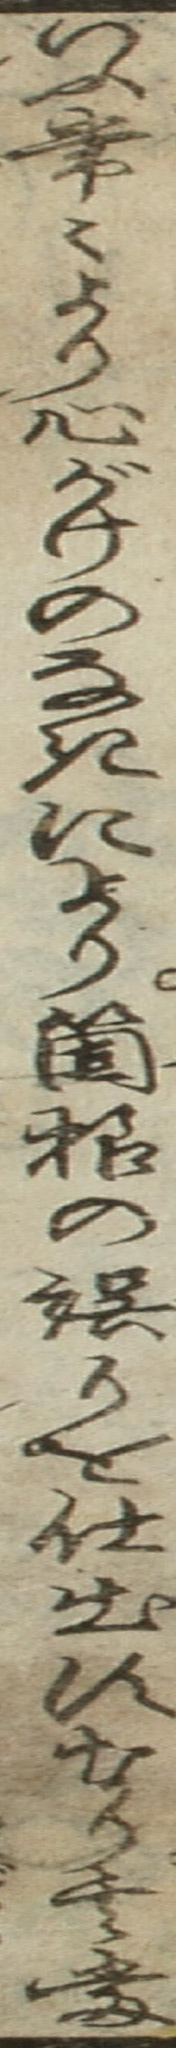いふ常々より心がけのなきにより。箇様の誤りを仕出すなり。其当
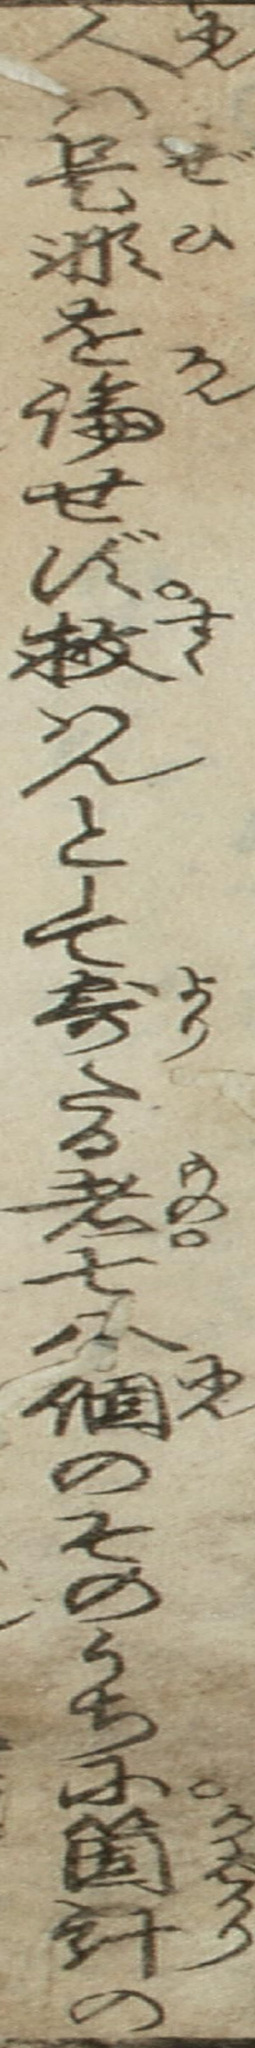人は是非を論せず。救はんとして寄たる者。七八個のそのうちに。箇計の
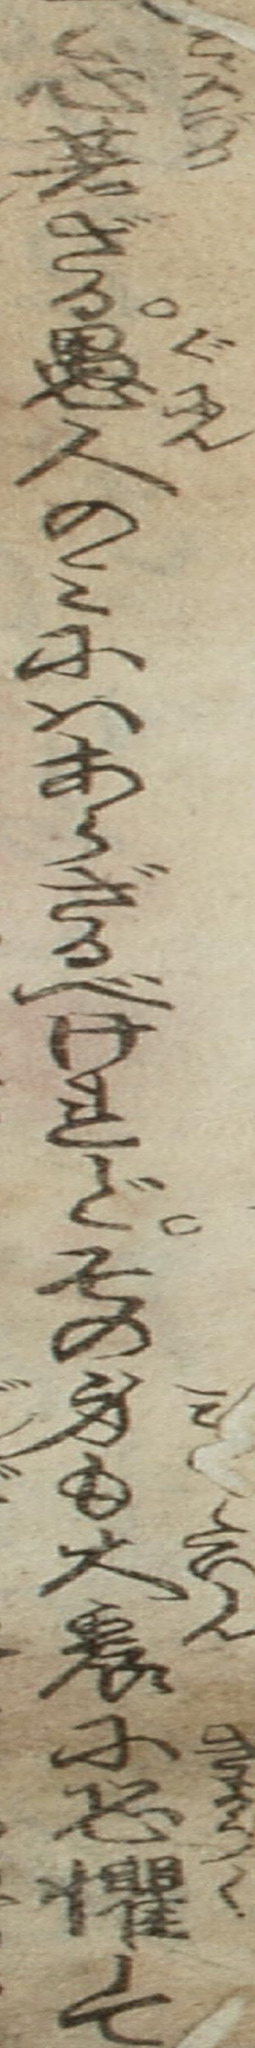一々心著ざる。愚人のみにあらざるべけれど。その身も大震に恐懼して
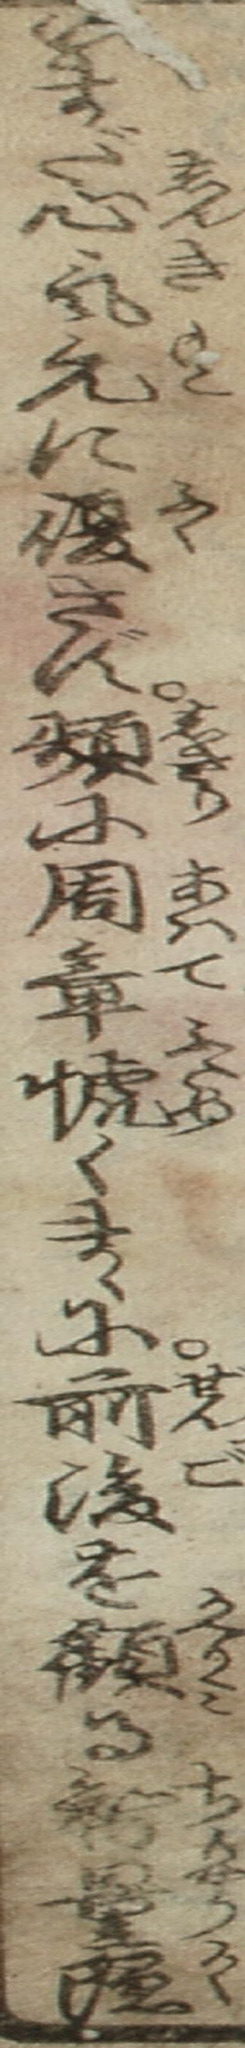いまだ心気元に復さず。頻に周章慌くまゝに。前後を顧る智量隠

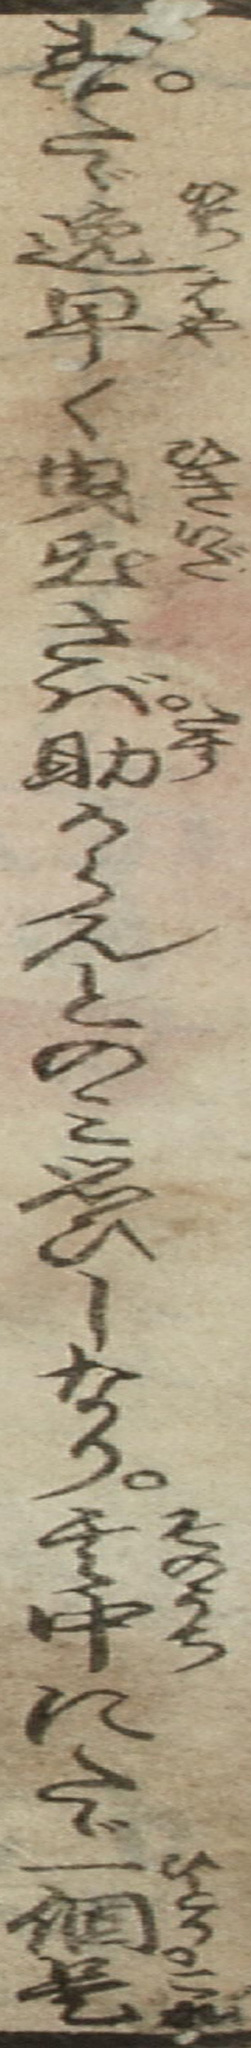れ。たゞ逸早く曳出さば。助からんとのみ思ひしなり。其中にたゞ一個。是
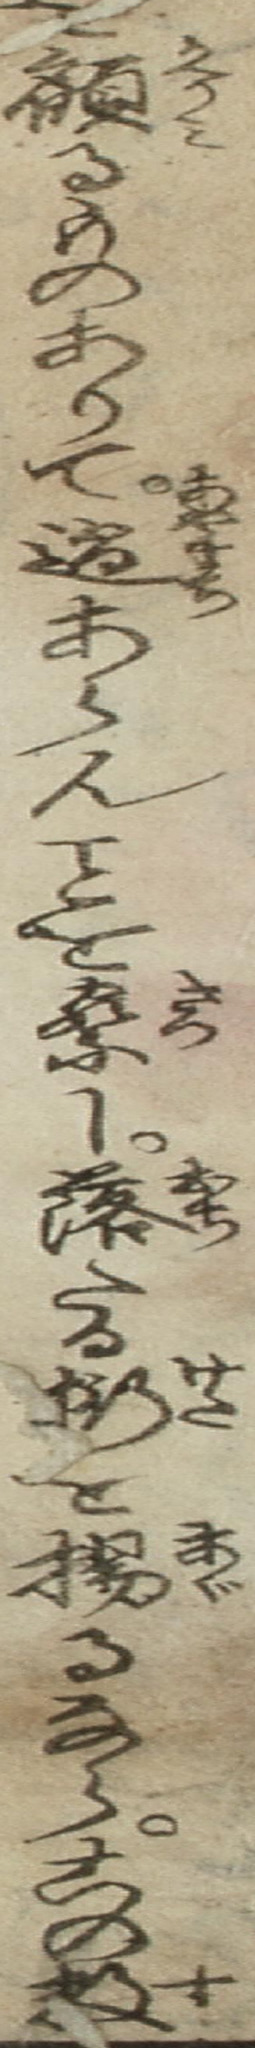を顧るものありて。過あらんことを察し。落たる桁を揚るなら。この数
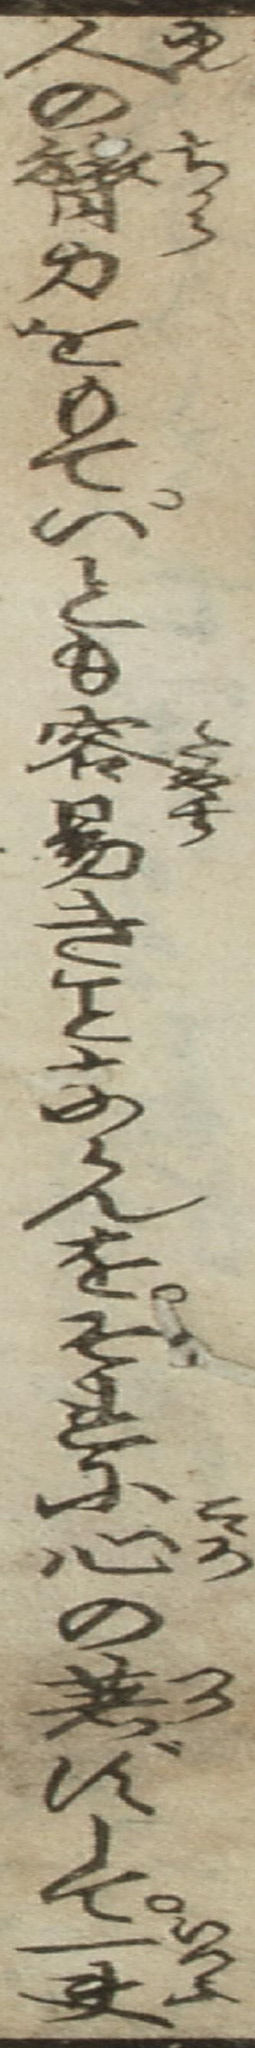人の膂力をもて。いとも容易きことあらんを。それに心の著ずして。一夫
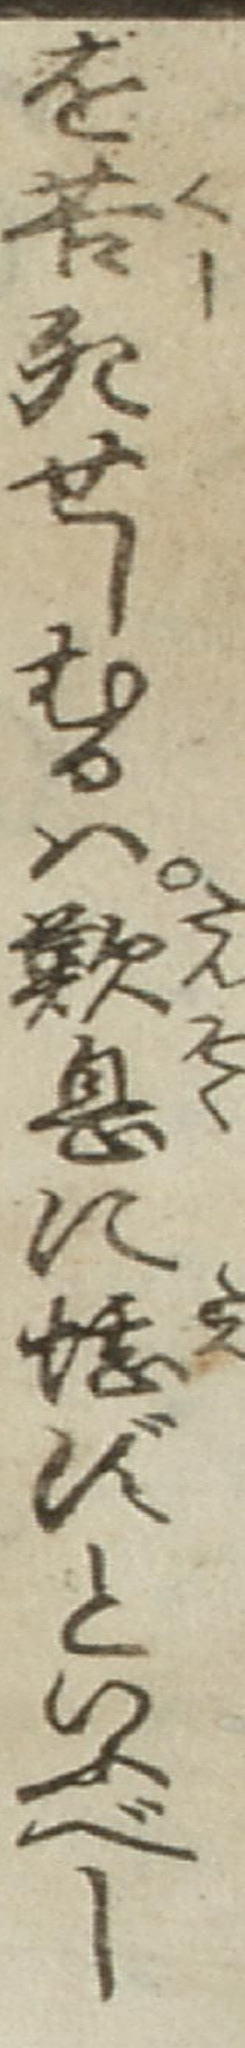を苦死せしむるは。歎息に堪ずといふべし
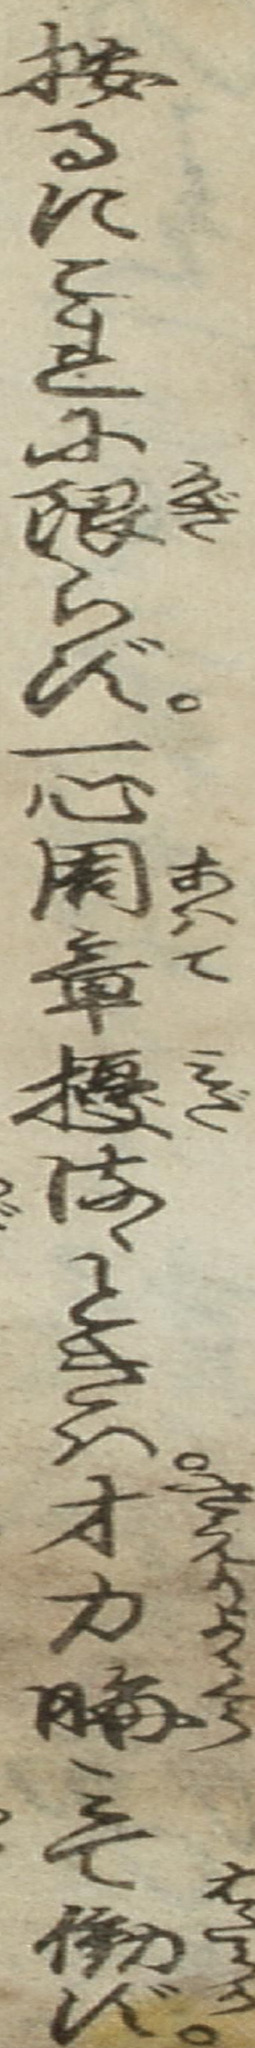按るにこれに限らず。一心周章擾るゝときは。才力晦みて働ず。
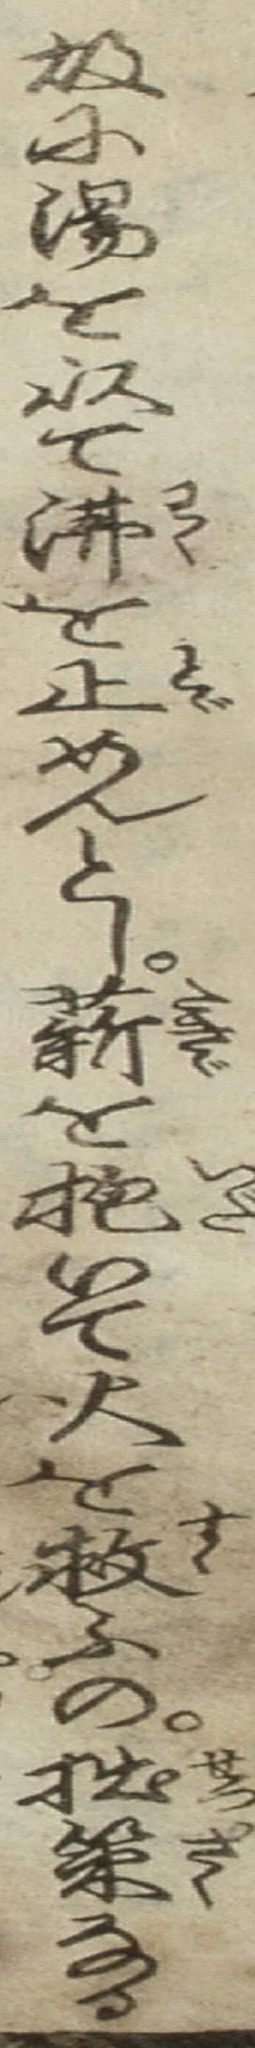故に湯を以て沸を止めんとし。薪を抱いて火を救ふの。拙策なる
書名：安政見聞録　中
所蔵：東京大学地震研究所図書室 Earthquake Research Institute Library, The University of Tokyo, JAPAN
